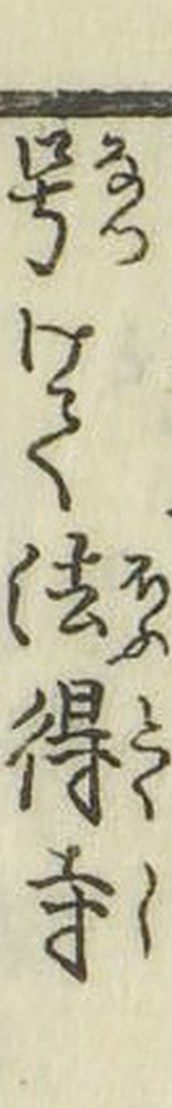号けて法得寺
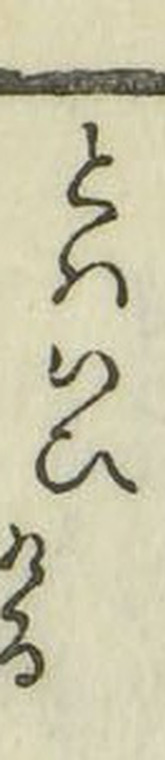とはいひける
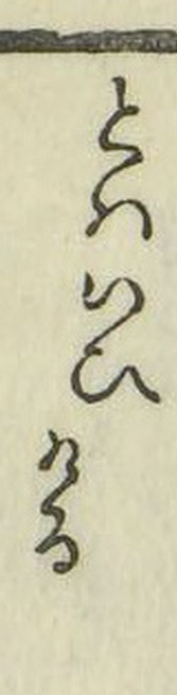とはいひける

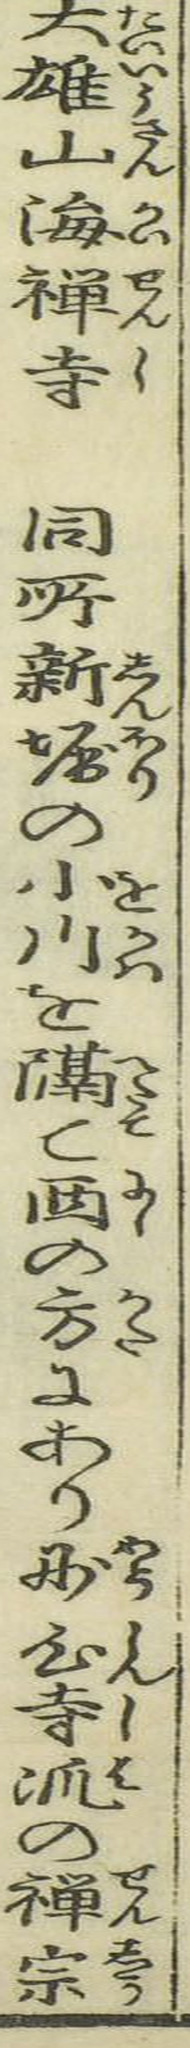大雄山海禅寺同所新堀の小川を隔て西の方にあり妙心寺派の禅宗
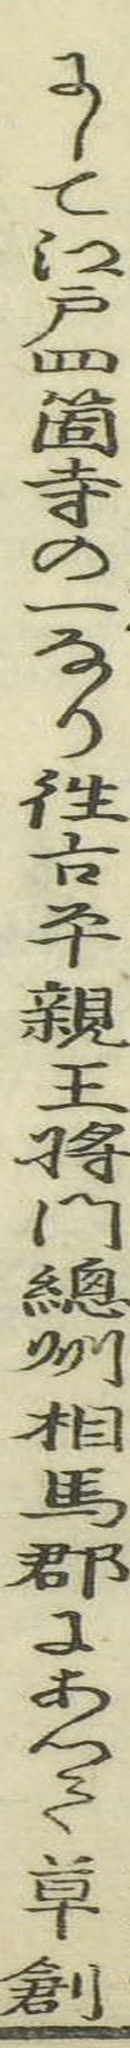にして江戸四箇寺の一なり往古平親王将門総州相馬郡にあつて草創
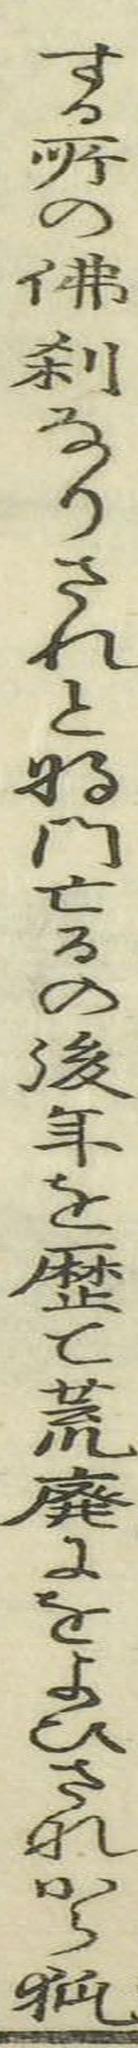する所の仏刹なりされと将門亡るの後年を歴て荒廃にをよひさなから狐
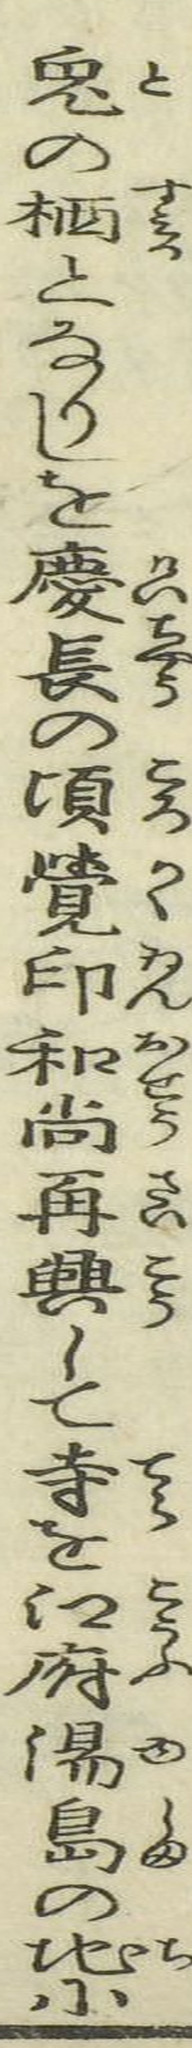兎の栖となりしを慶長の頃覚印和尚再興して寺を江府湯島の地に
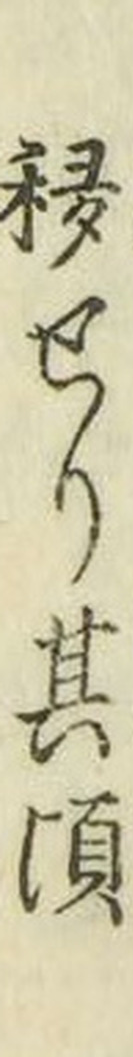移せり其頃
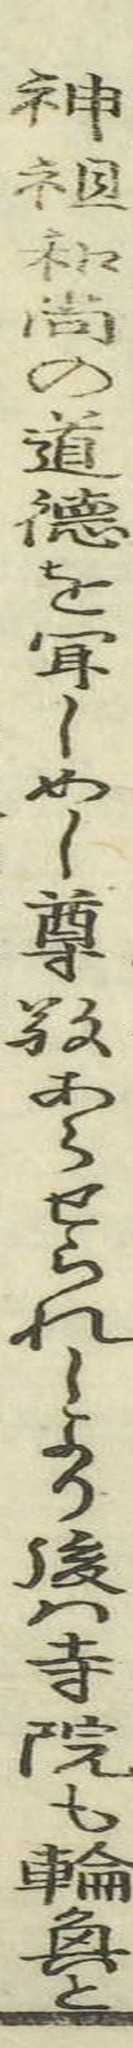神祖和尚の道徳を聞しめし尊敬あらせられしより後は寺院も輪奐と
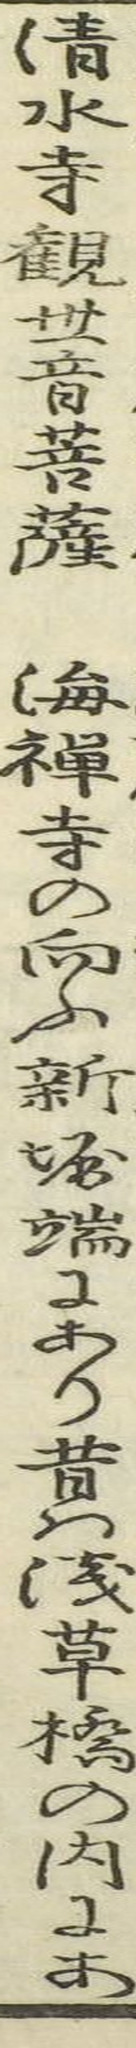清水寺観世音菩薩海禅寺の向ふ新堀端にあり昔は浅草橋の内にあ
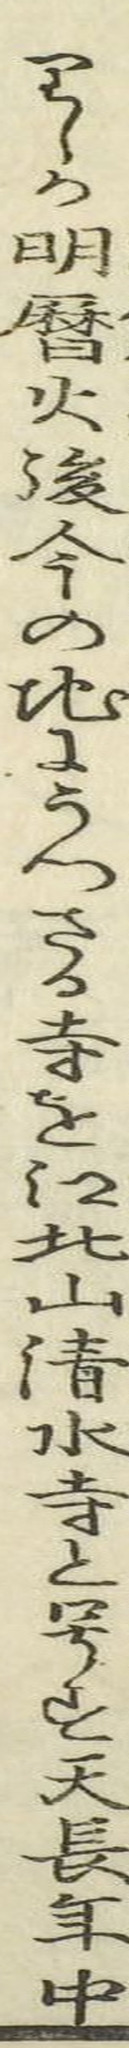りしか明暦火後今の地にうつさる寺を江北山清水寺と号す天長年中
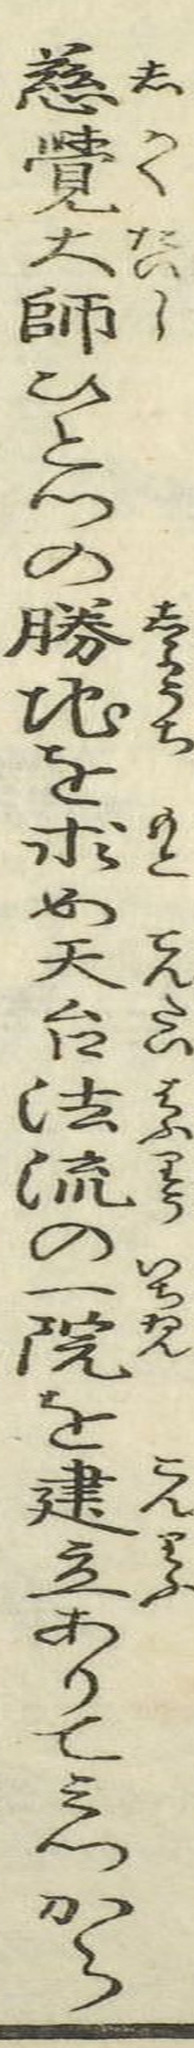慈覚大師ひとつの勝地を求め天台法流の一院を建立ありてみつから
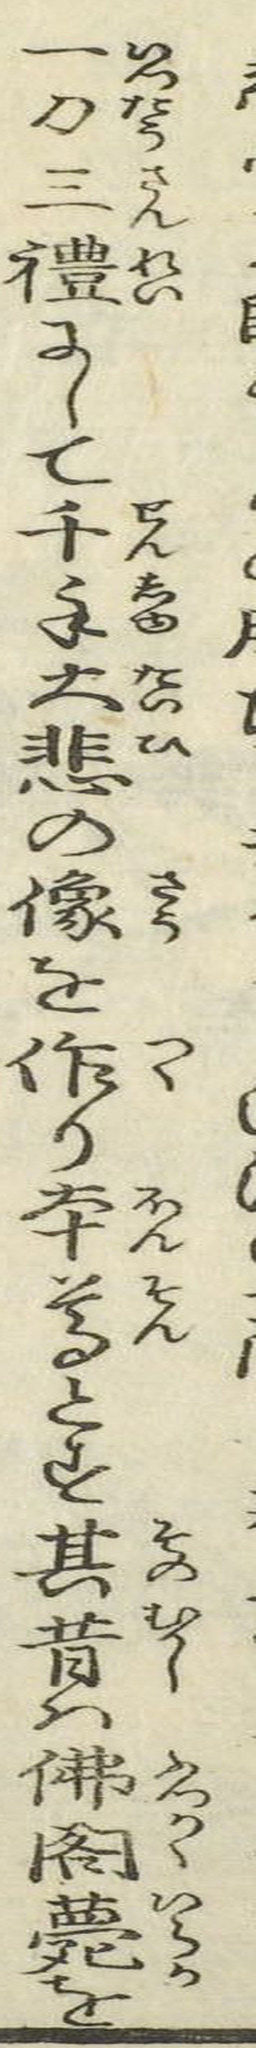一刀三礼にして千手大悲の像を作り本尊とす其昔は仏閣甍を
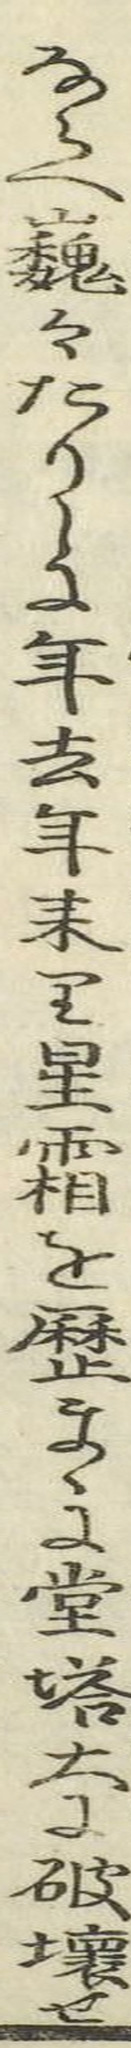ならへ巍々たりしに年去年来り星霜を歴まゝに堂塔大に破壊せ
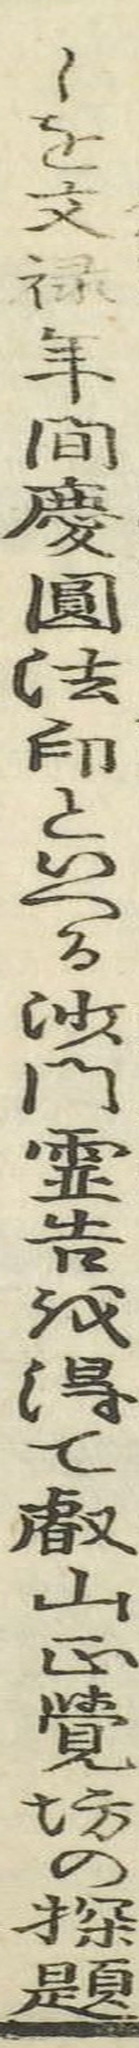しを文禄年間慶円法印といへる沙門霊告を得て叡山正覚坊の探題
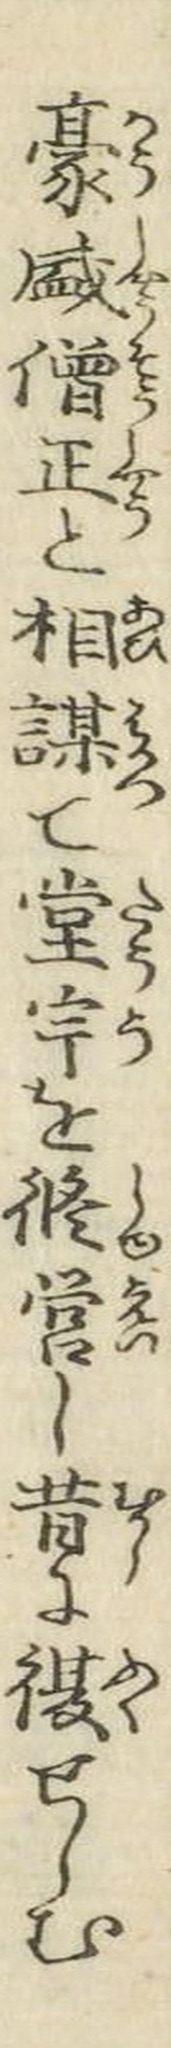豪盛僧正と相謀て堂宇を修営し昔に復せしむ
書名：江戸名所図会 20巻 巻之16
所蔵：東京学芸大学教育コンテンツアーカイブ
